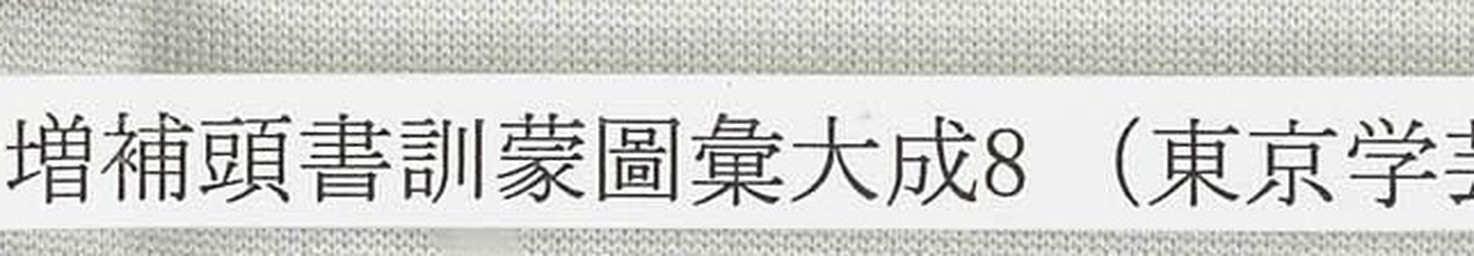増補頭書訓蒙図彙大成八

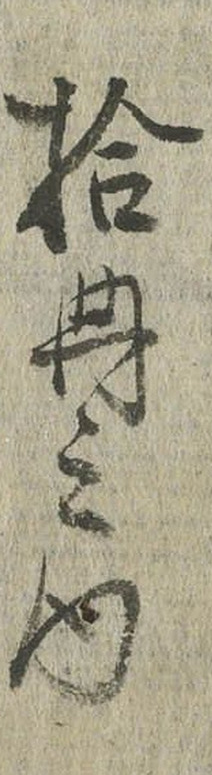拾冊之内
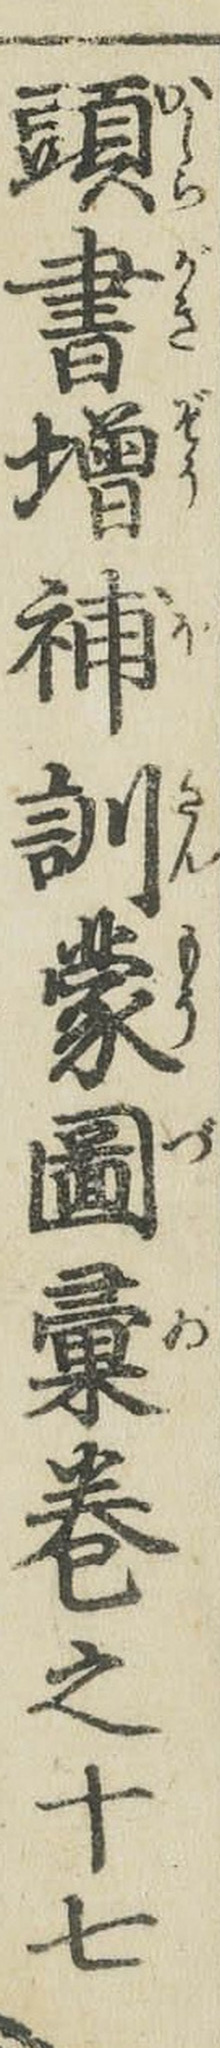頭書増補訓蒙図彙巻之十七
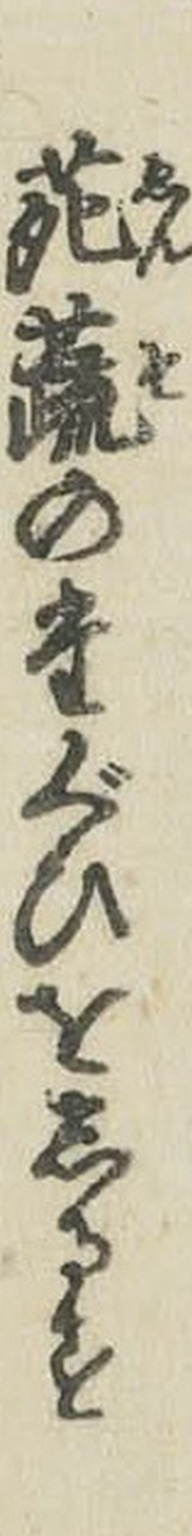苑蔬のたぐひをしるす
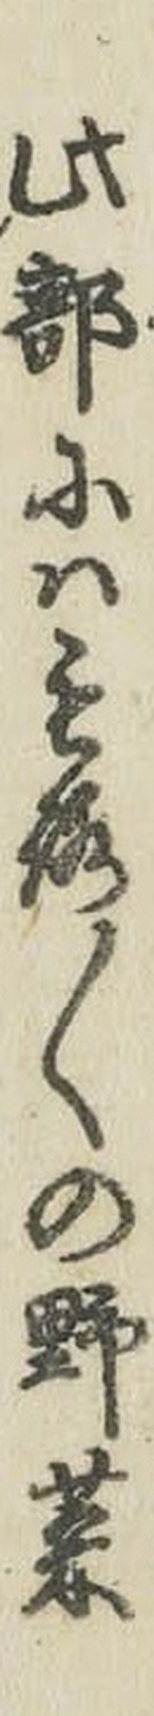此部にはもろ〳〵の野菜
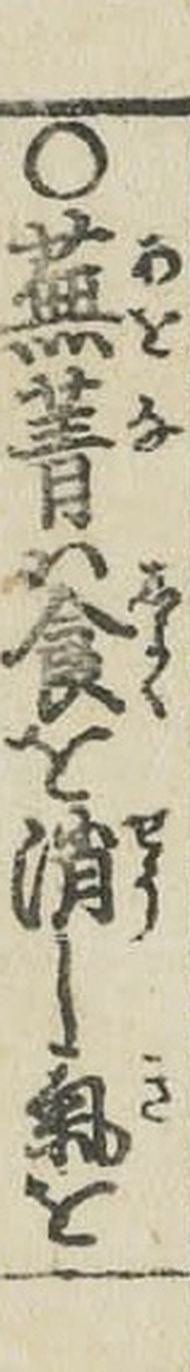○蕪菁は食を消し気を
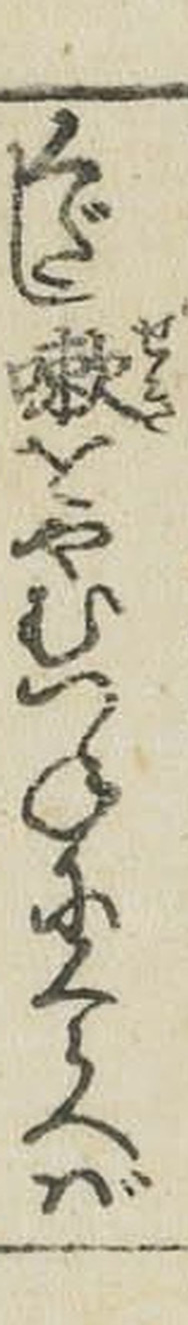くだし嗽をやむつねにくらへば
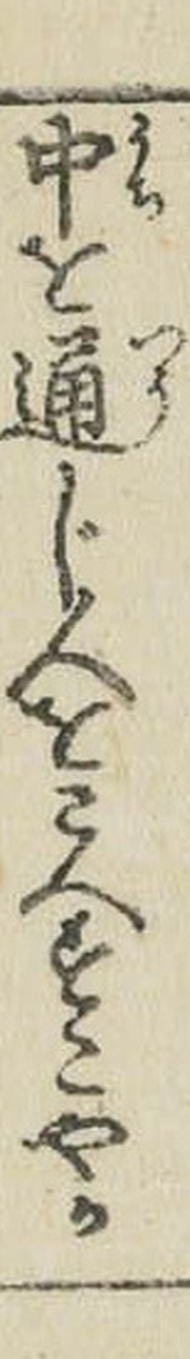中を通じ人をこへすこやか
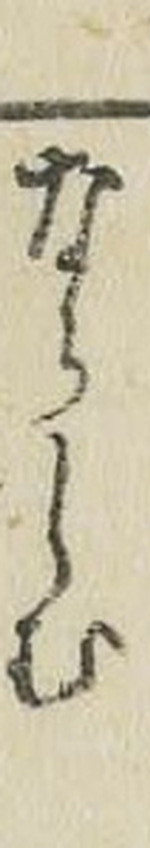ならしむ
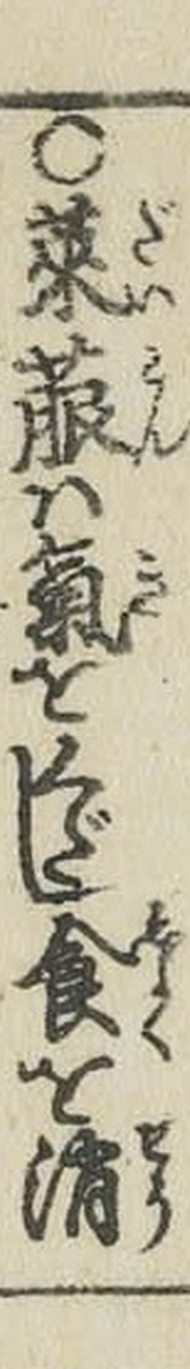○萊菔は気をくだし食を消
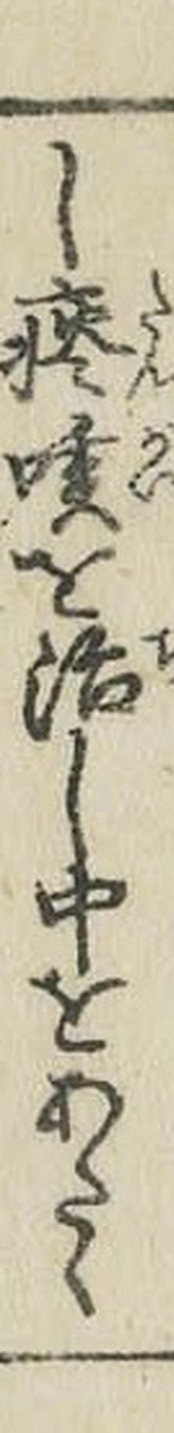し痰咳を治し中をあたゝ
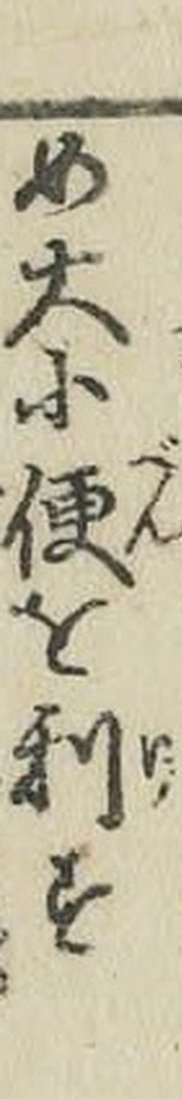め大小便を利す
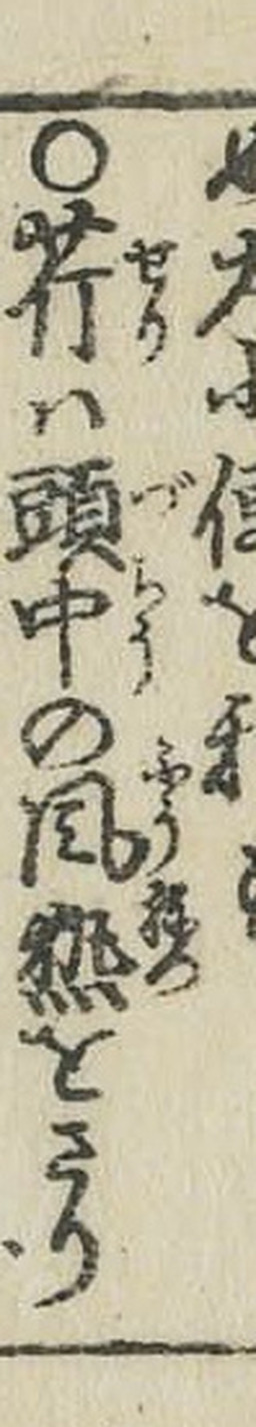○芹は頭中の風熱をさり
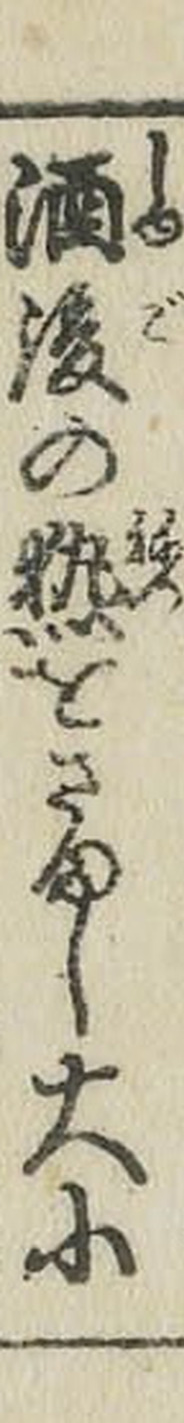酒後の熱をさまし大小
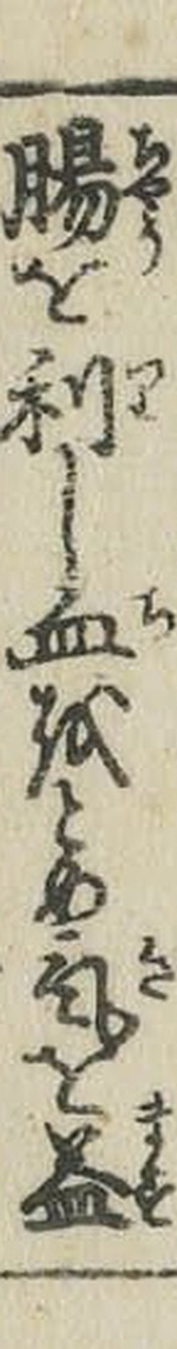腸を利し血をとめ気を益
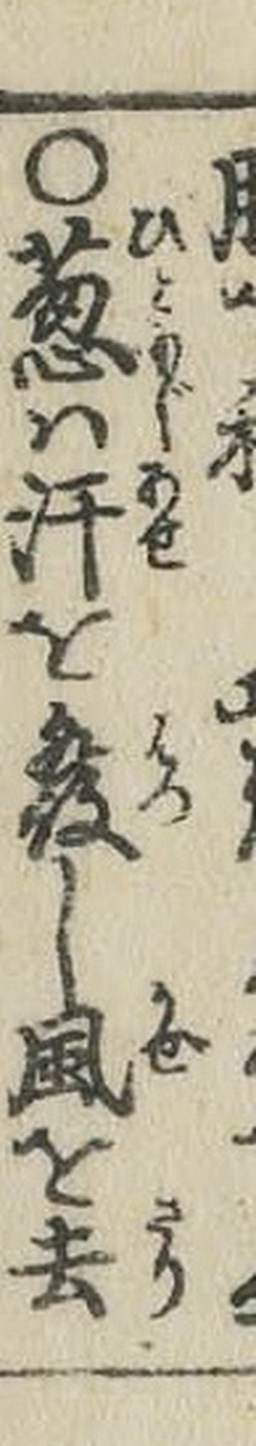○葱は汗を発し風を去
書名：増補頭書訓蒙図彙大成 10巻 8:巻之17-19
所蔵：東京学芸大学教育コンテンツアーカイブ
